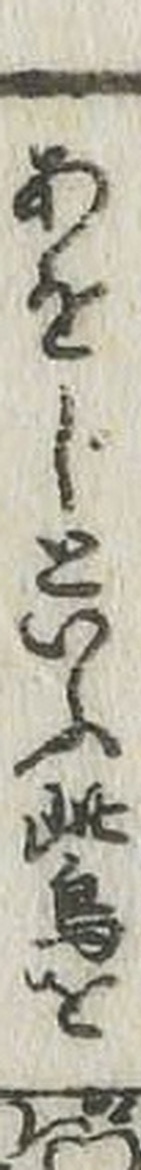あをじといふ此鳥を
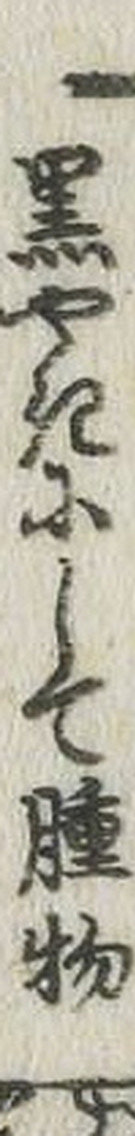黒やきにして腫物
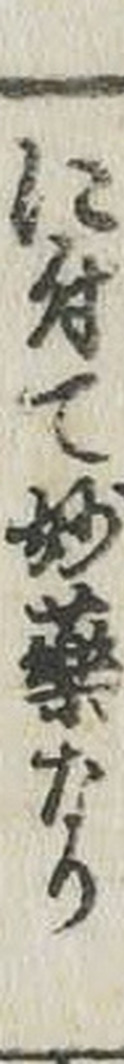に付て妙薬なり

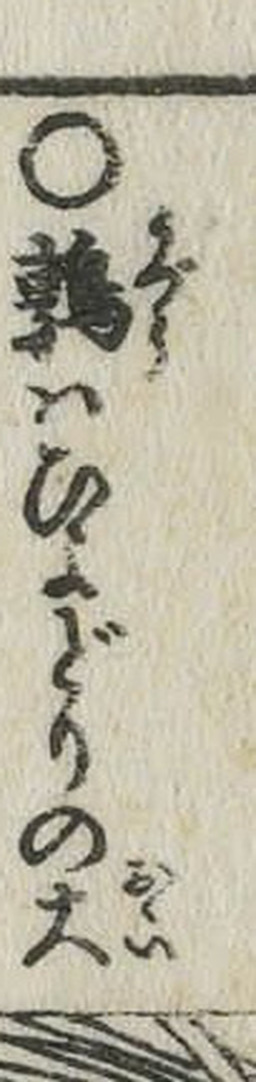○鶉はひよどりの大
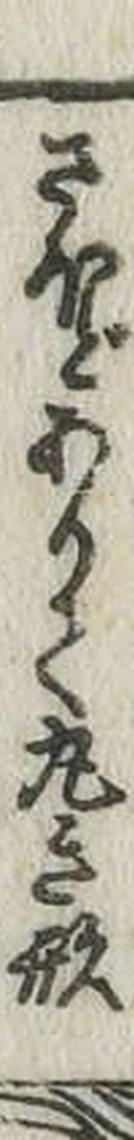さほどありて丸き形
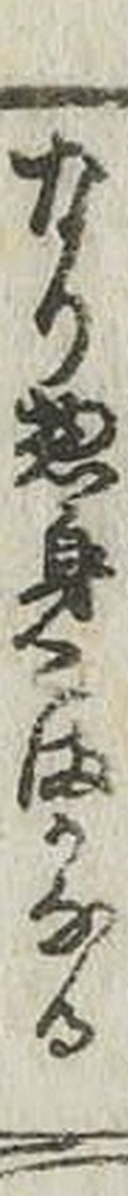なり惣身こまかなる
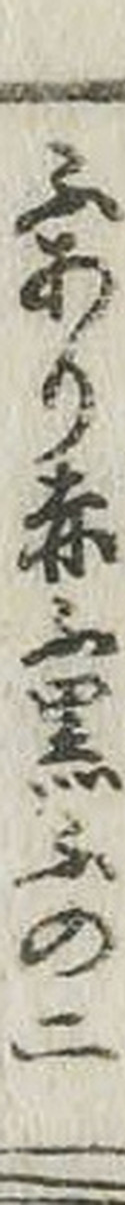ふあり赤ふ黒ふの二
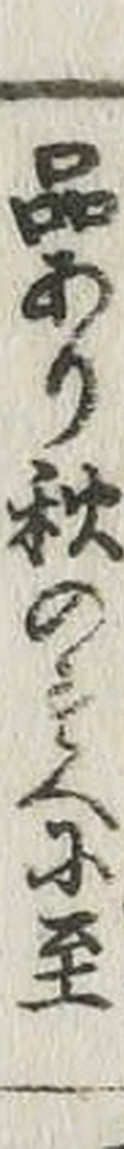品あり秋のすへに至
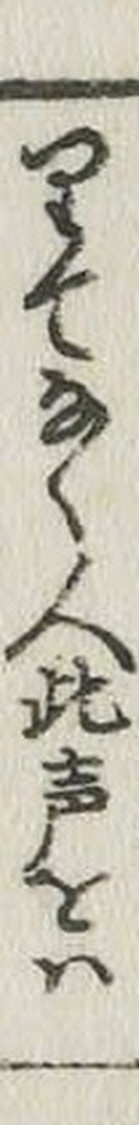りてなく人此声をは
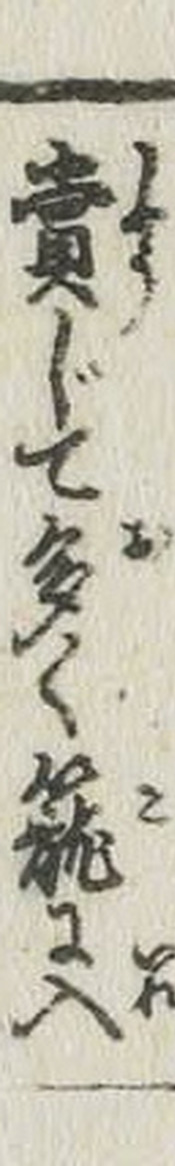賞じて多く籠に入
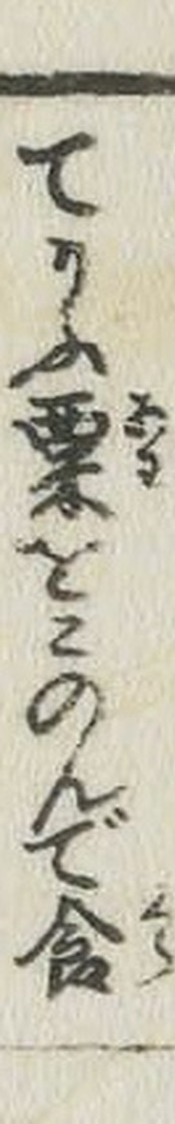てかふ粟をこのんで食
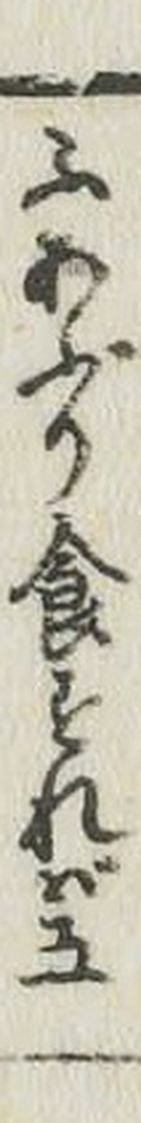ふあぶり食すれば五
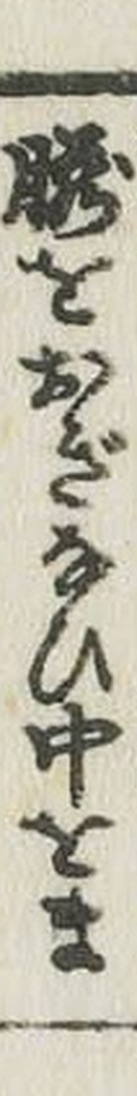臓をおぎなひ中をま
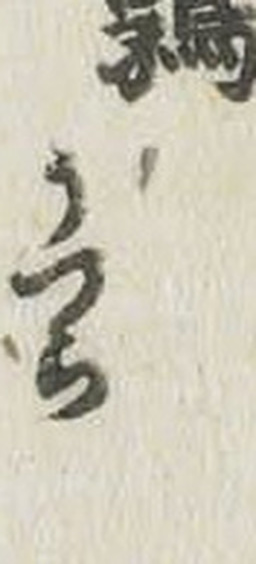うつら
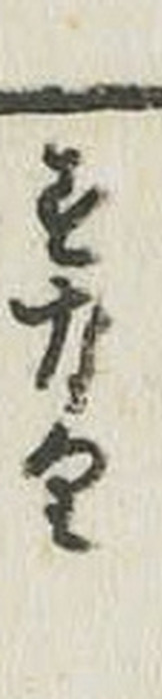すなり
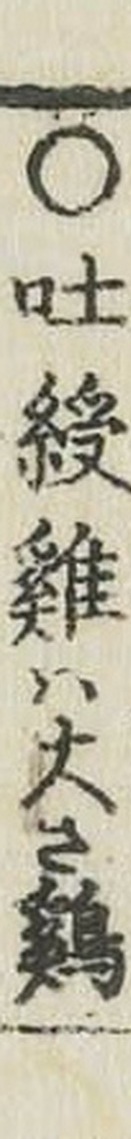○吐綬鶏は大さ鶏
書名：増補頭書訓蒙図彙大成 10巻 6:巻之12-13
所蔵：東京学芸大学教育コンテンツアーカイブ
